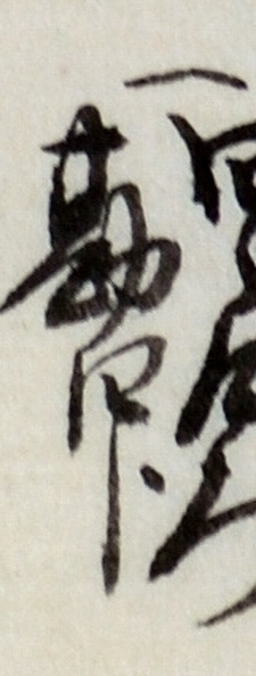勘四郎
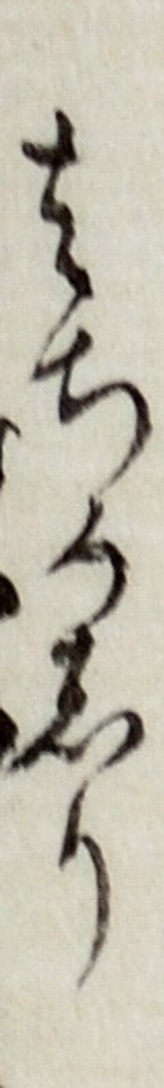はちうしり
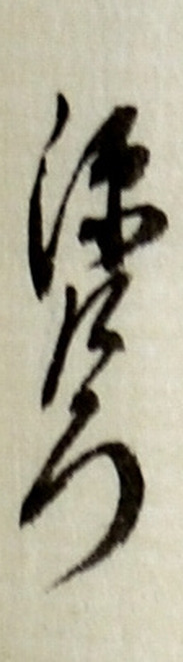甚左衛門
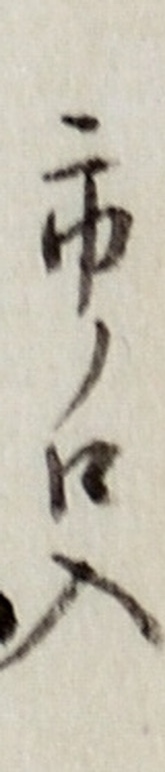市ノ口入
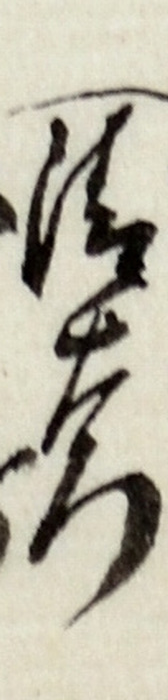清右衛門
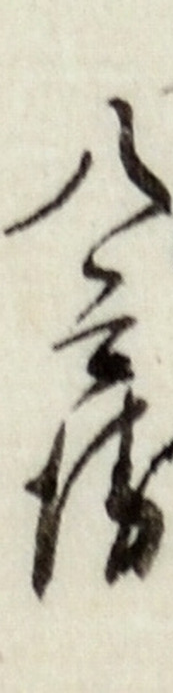八兵衛
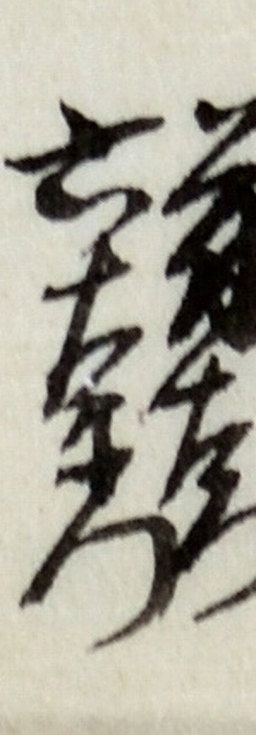六右衛門
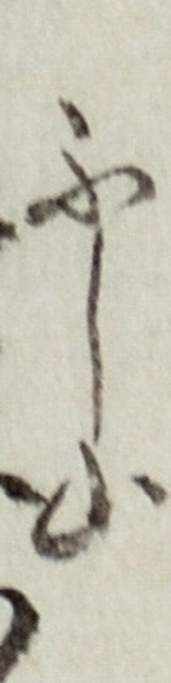ふし山
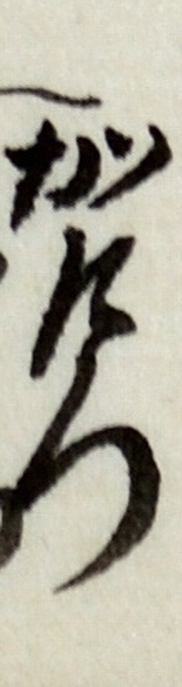甚左衛門
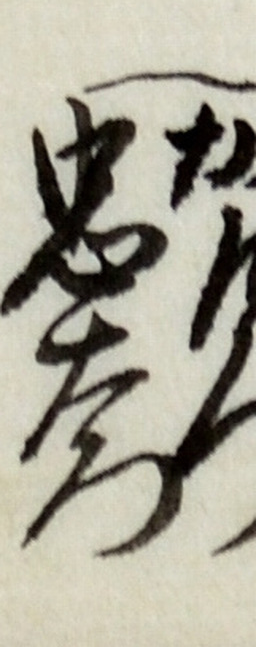忠右衛門
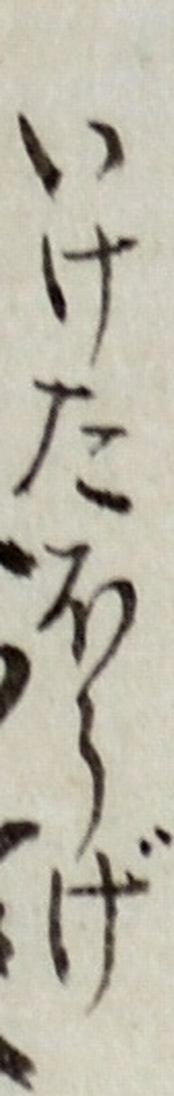いけたほらげ
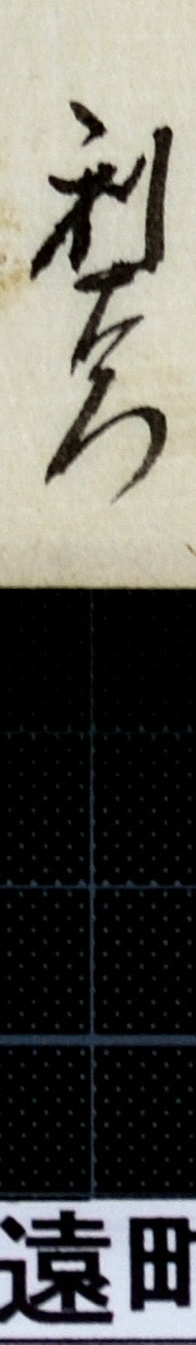甚右衛門
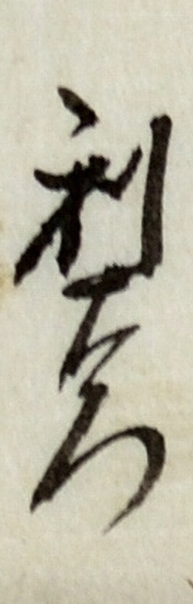甚右衛門
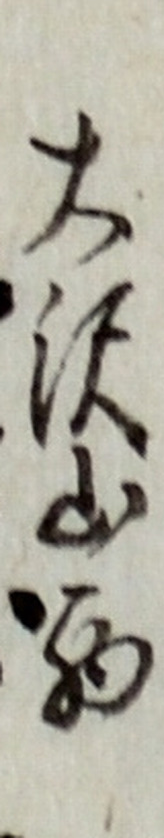大沢山西
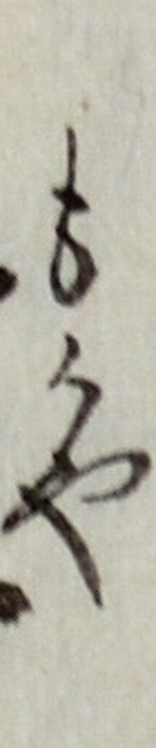もかや
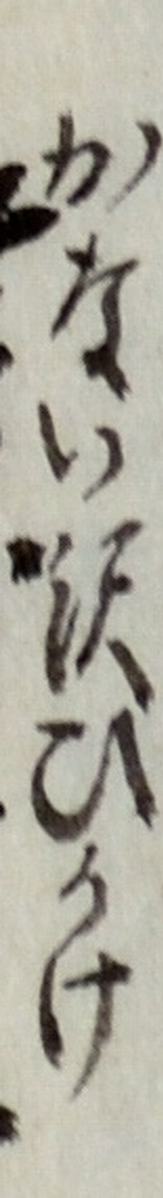かない沢ひかけ
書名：御領分中山林社地手控
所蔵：伊那市立高遠町図書館・合同会社AMANE
